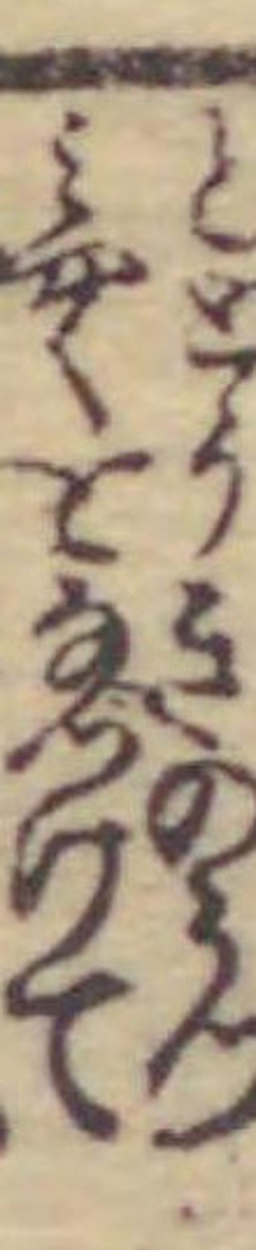みやくをなつけて
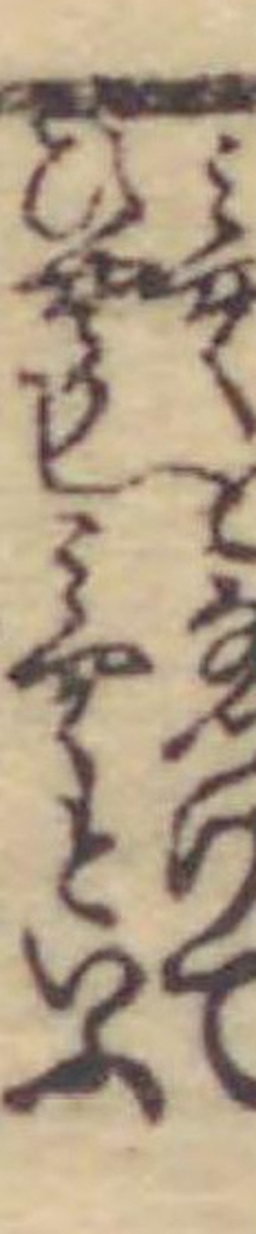ひやうしみやくといふ
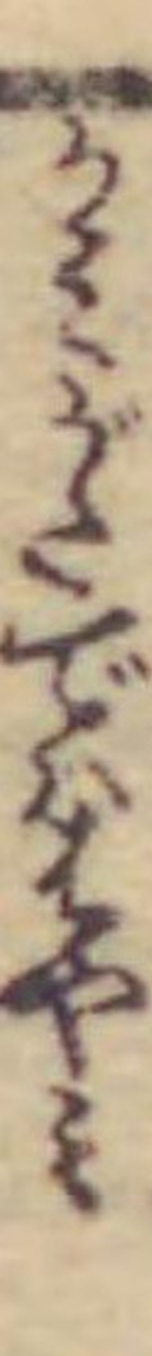かみがたでははやみ
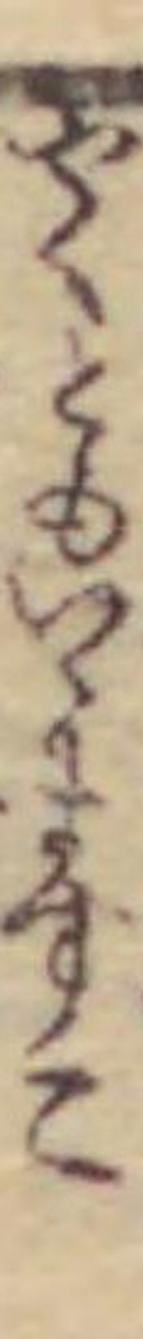やくともいゝますこ
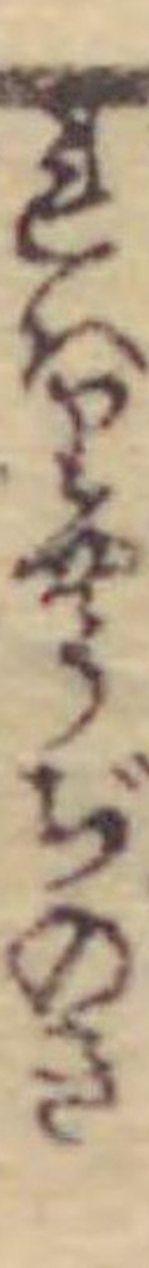れはりやうぢのき
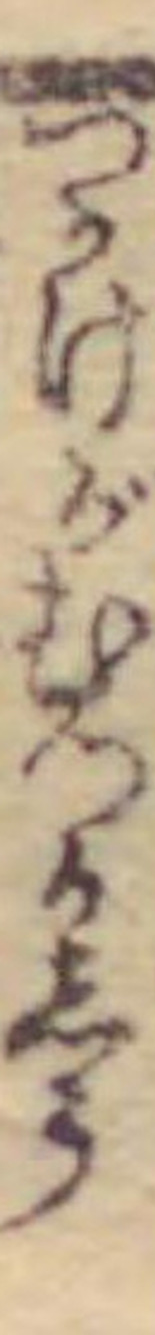つかけがむつかしう
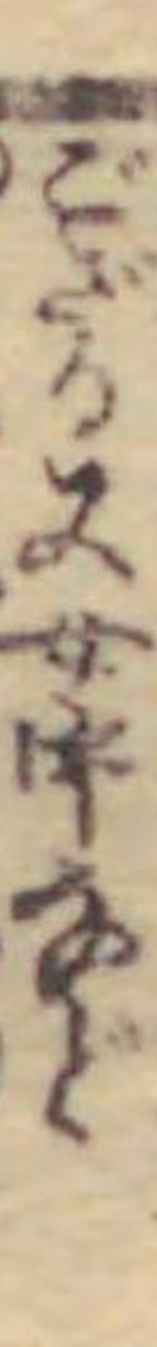ござる又女中など
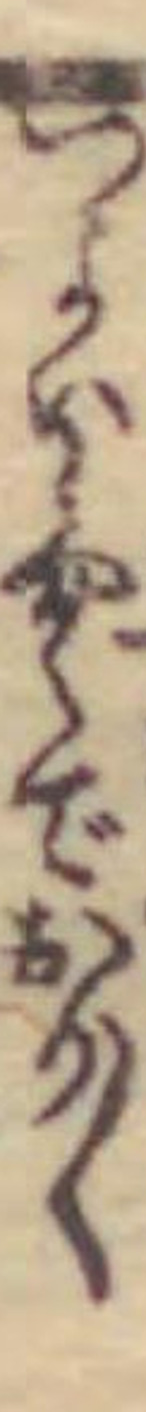つよいみやくでおり〳〵
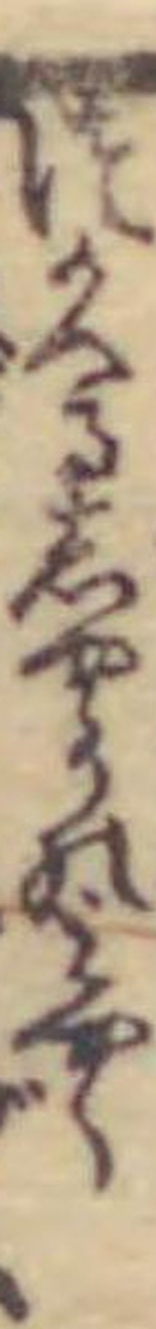つかへるしやうのみやく
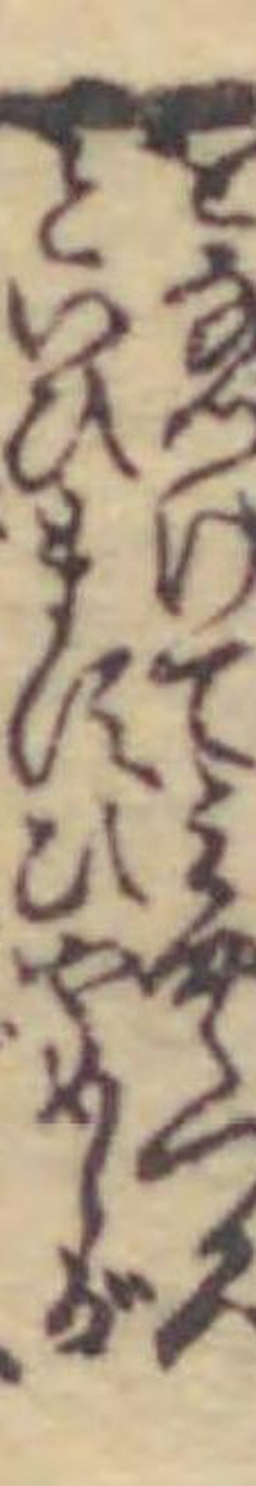といひますひやめしが
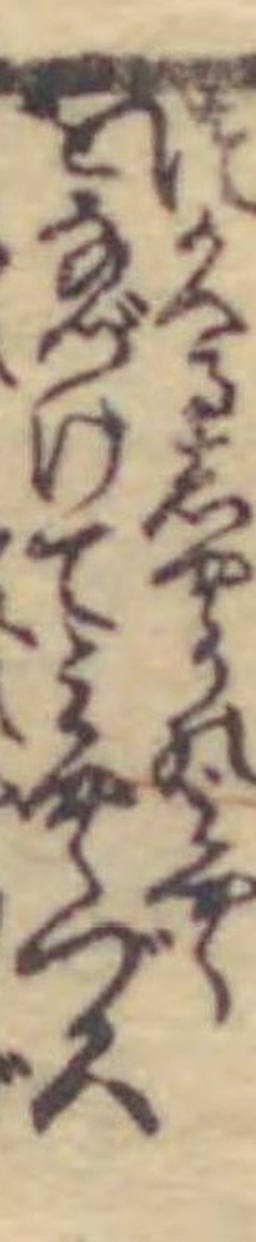をなづけてみやくづかへ
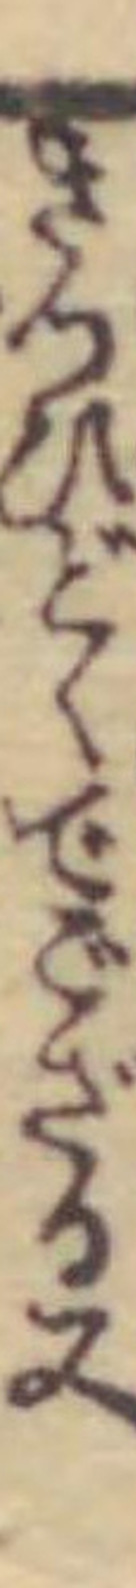きつひどくでござる又
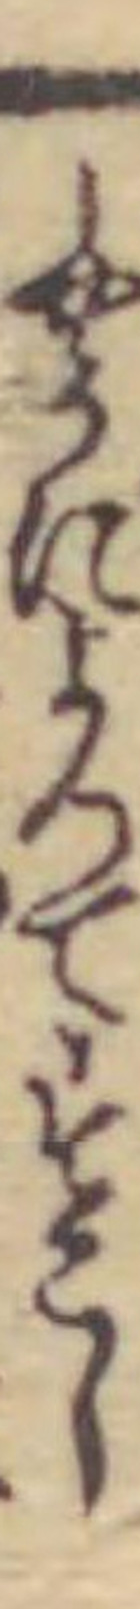しやうによつてすこし
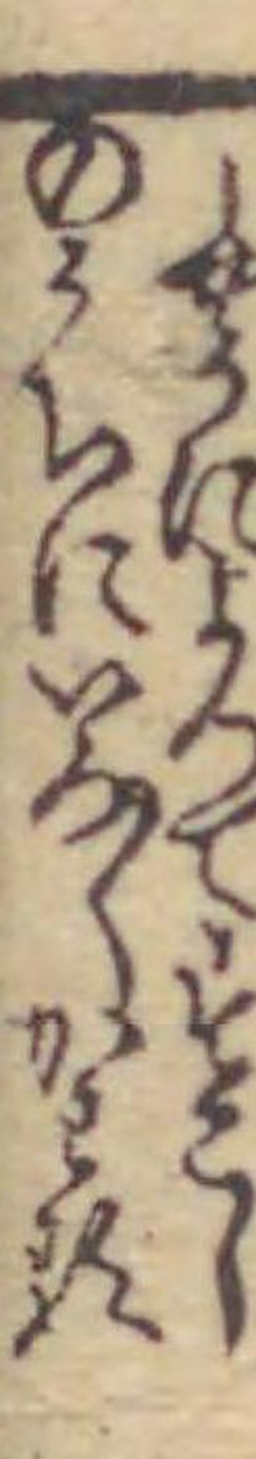のうちにいろ〳〵かわる
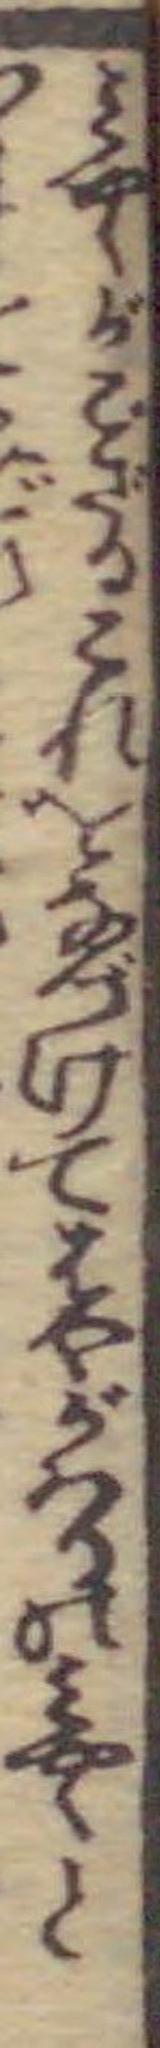みやくがこさるこれをなづけてはやがはりのみやくと
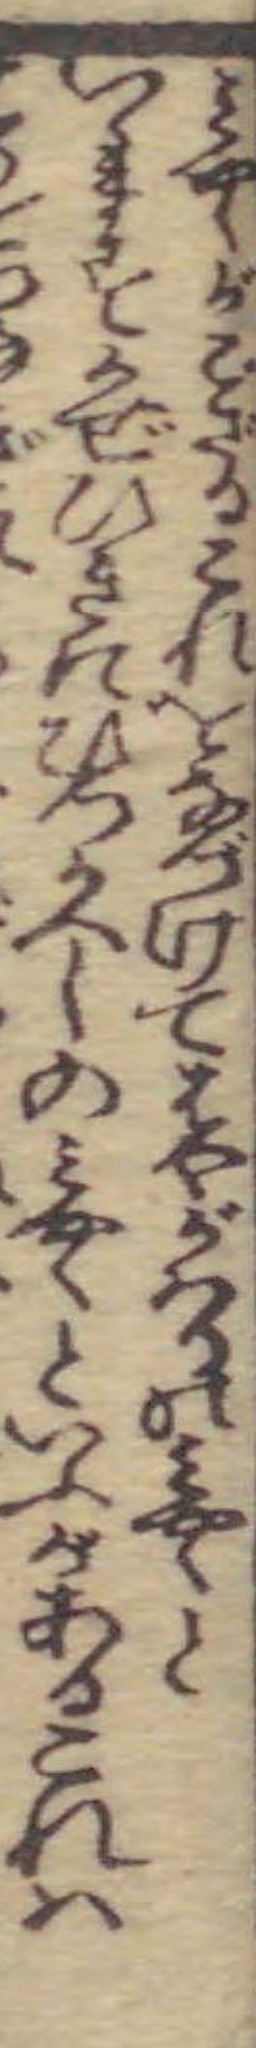いゝますかぜひきにひつかへしのみやくといふがあるこれは
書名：御誂染長寿小紋 : 3巻
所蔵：国立国会図書館 National Diet Library, JAPAN
